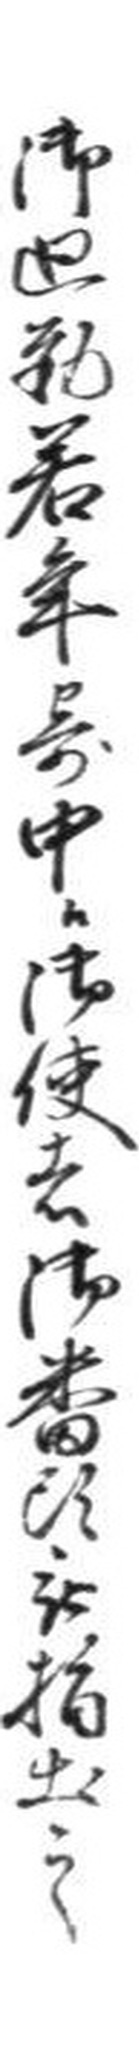御廻勤若年寄中江御使者御番頭被指出之
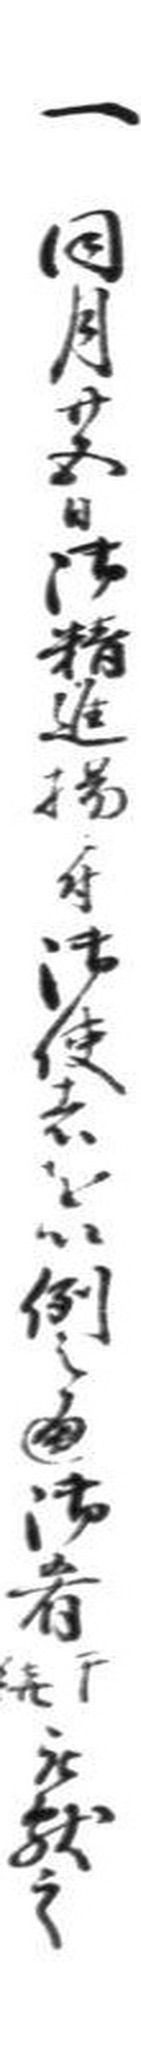一同月廿五日御精進揚ニ付御使者を以例之通御肴干鱚被献之
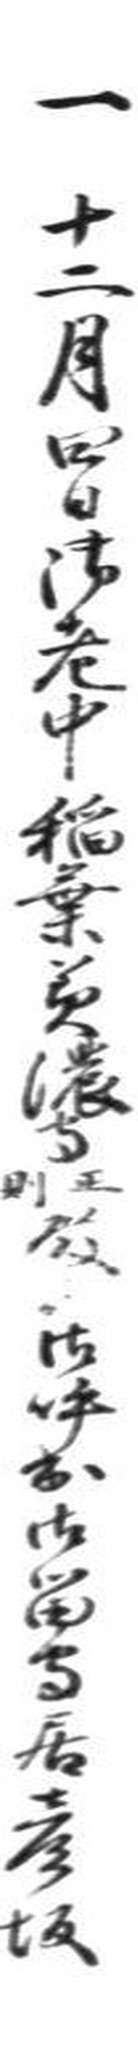一十二月四日御老中稲葉美濃守正則殿ゟ御呼出御留守居彦坂
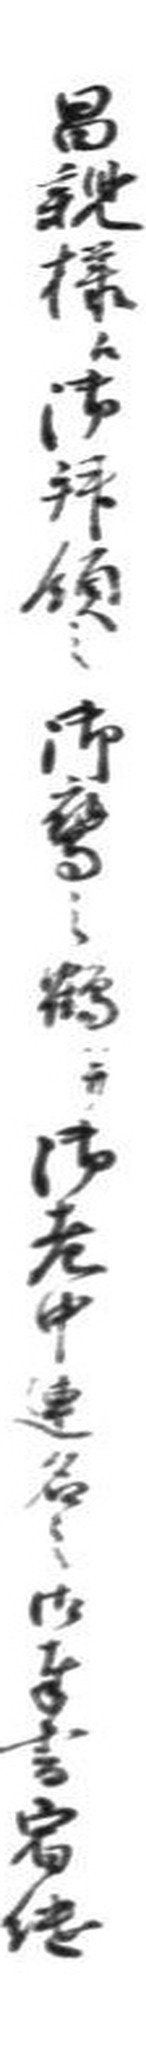昌親様江御拝領之御鷹之鶴并御老中連名之御奉書宿継
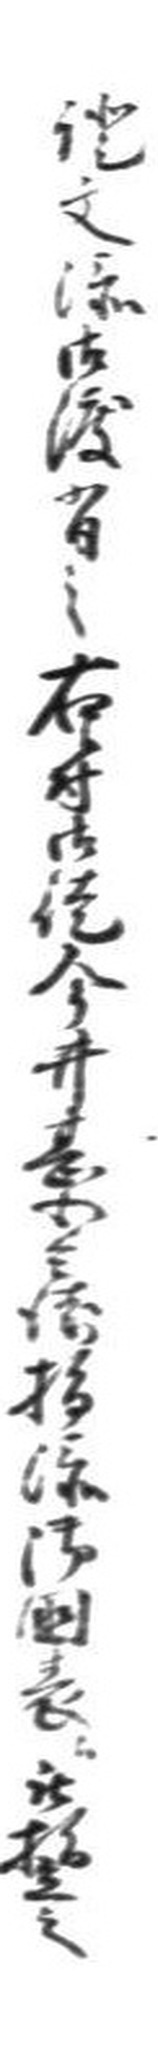証文添御渡有之右ニ付御徒今井甚五兵衛指添御国表江被指立之
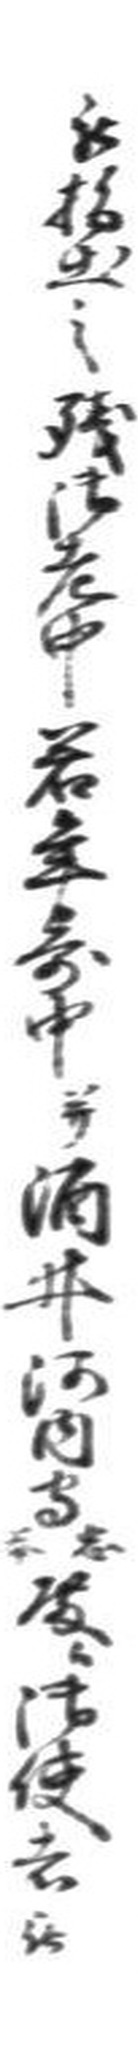被指出之残御老中若年寄并酒井河内守忠挙殿江御使者被
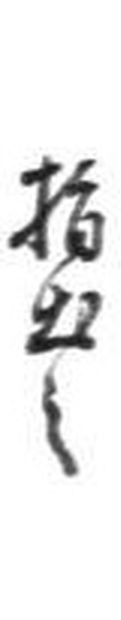指出之
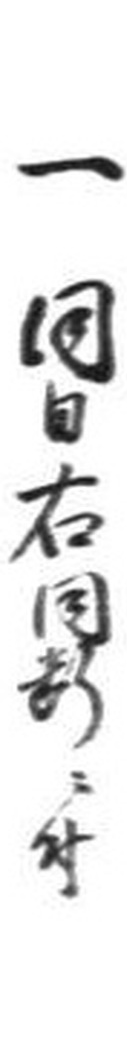一同日右同断ニ付

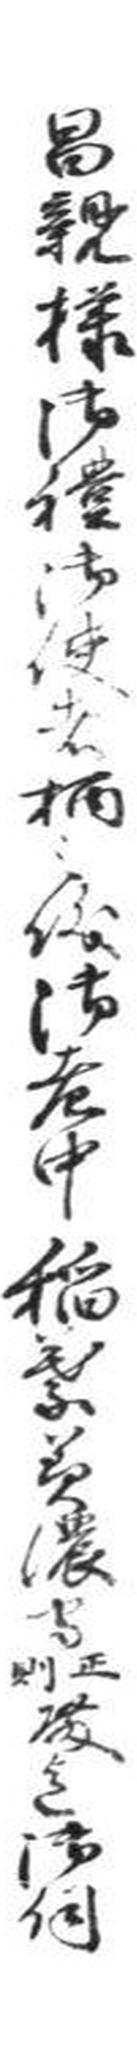昌親様御礼御使者柄之儀御老中稲葉美濃守正則殿迄御伺
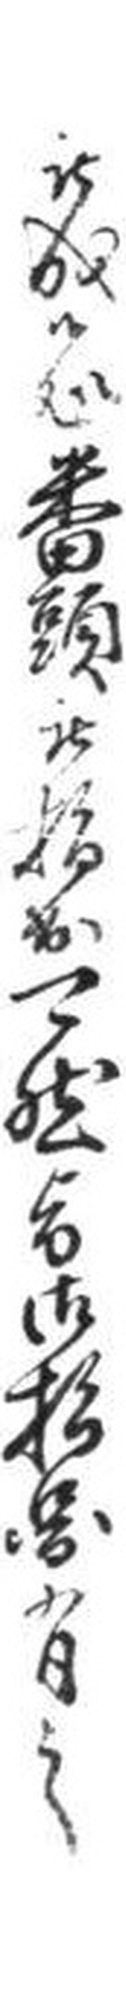被成候処番頭被指出可然旨御指図有之
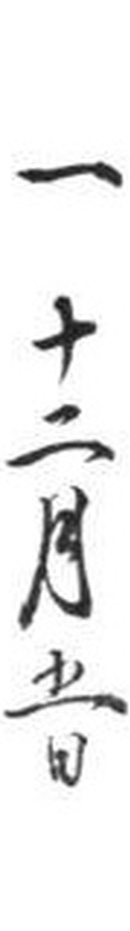一十二月五日
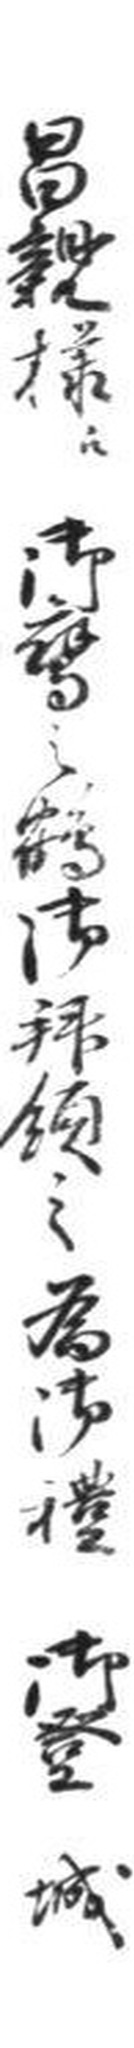昌親様江御鷹之鶴御拝領之為御礼御登城
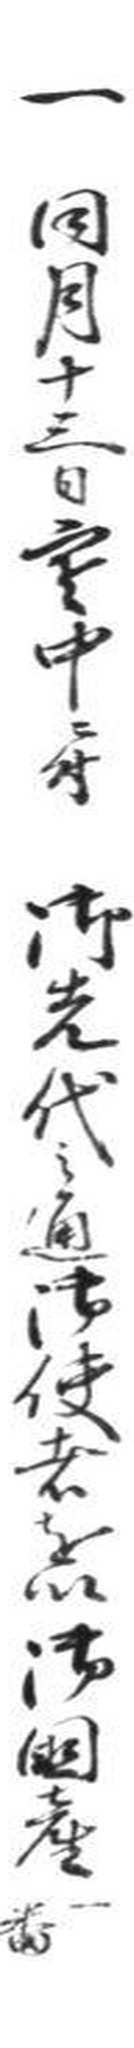一同月十三日寒中ニ付御先代之通御使者を以御国産一番
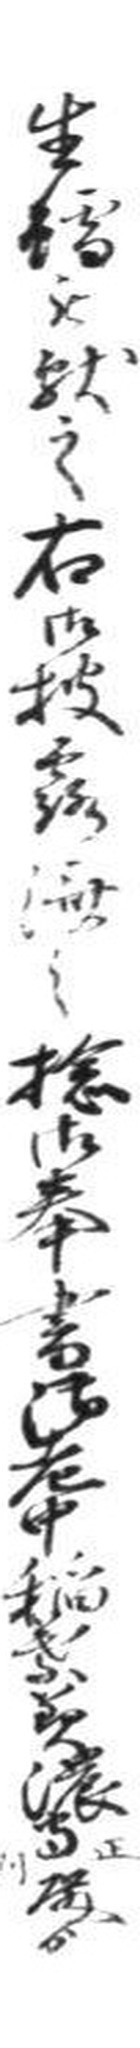生鱈被献之右御披露済之捻御奉書御老中稲葉美濃守正則殿ゟ
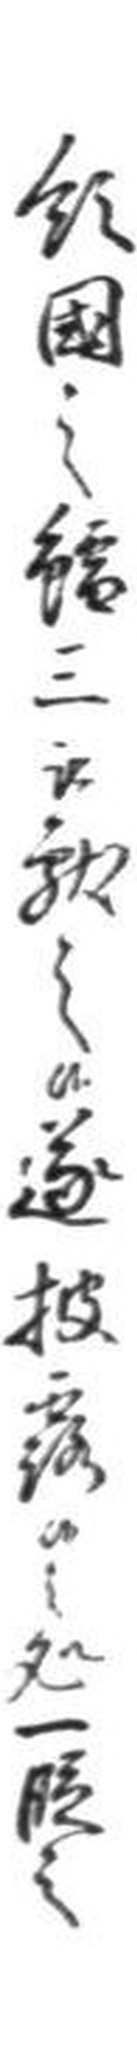領国之鱈三被献之候遂披露候之処一段之
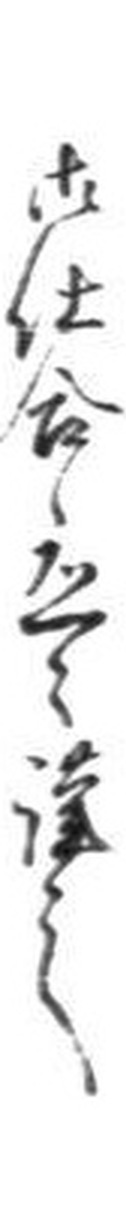御仕合候恐々謹言
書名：家譜 十三 綱昌公 従寛文元年到延宝五年
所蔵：福井県文書館 Fukui Prefectural Archives
